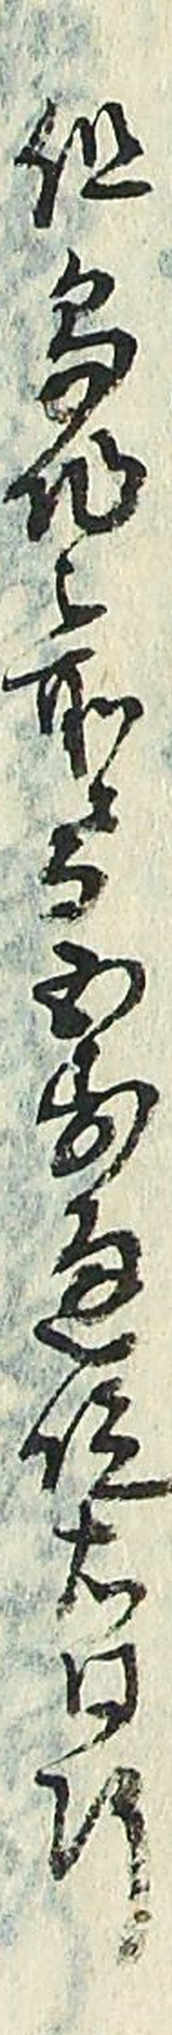但畠作之所ニ而五歩通位右同断

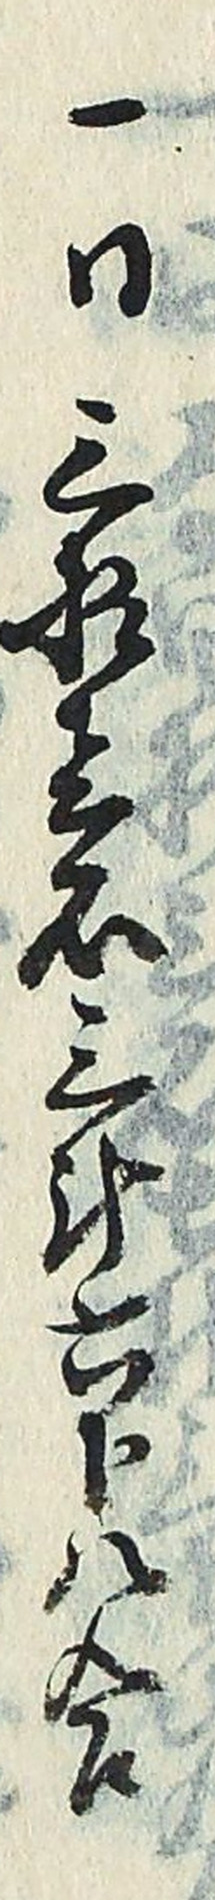一同三拾壱石三斗六升八合
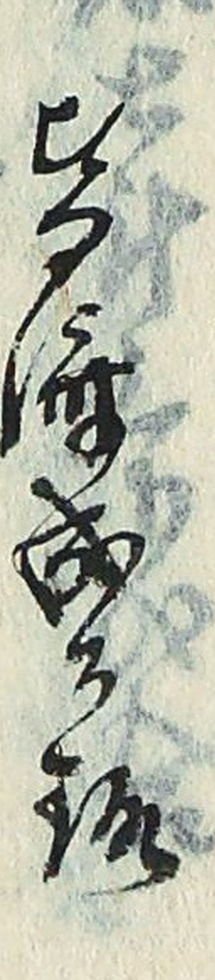皆済成候趣
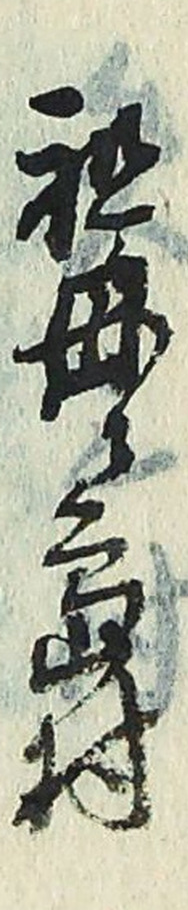祖母ヶ島村
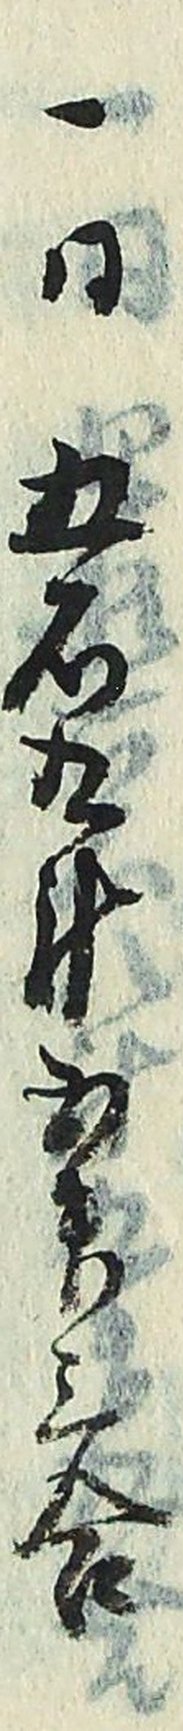一同五石九斗五升三合
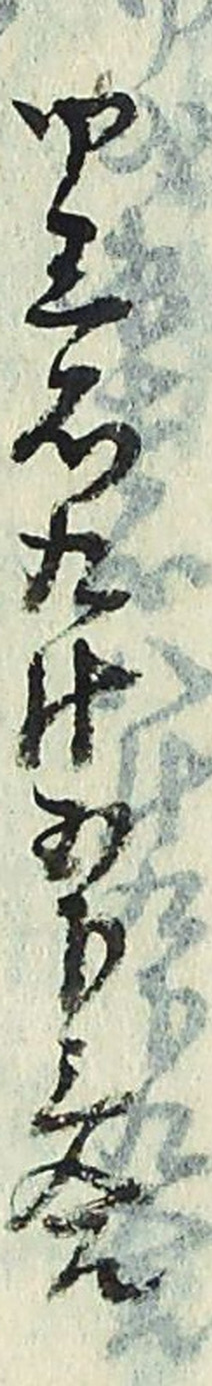一同五石九斗五升三合
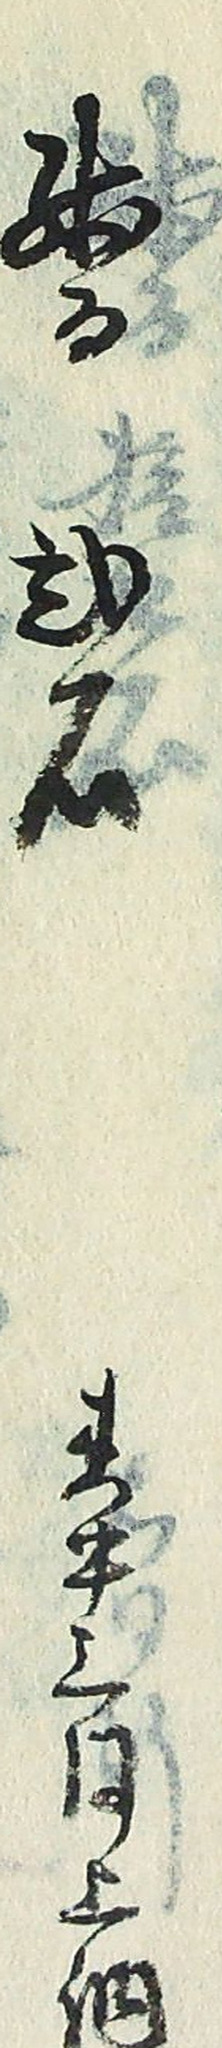残而弐石来申三月上納
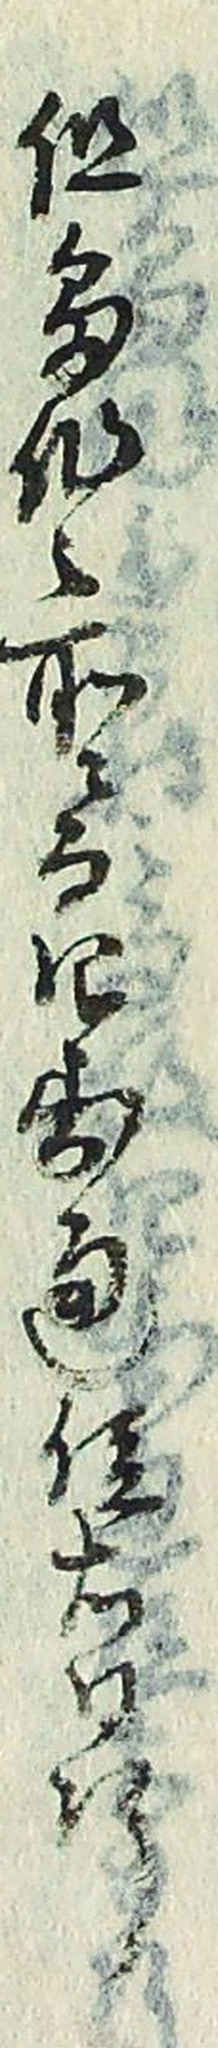但畠作之所ニ而四歩通位右同断
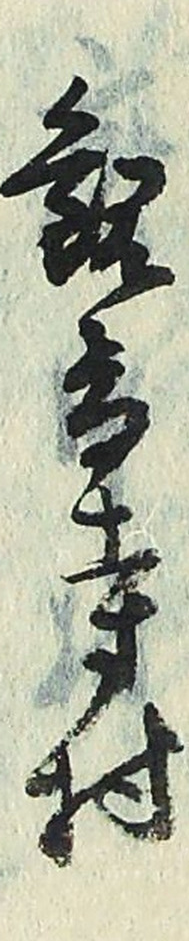観音寺村
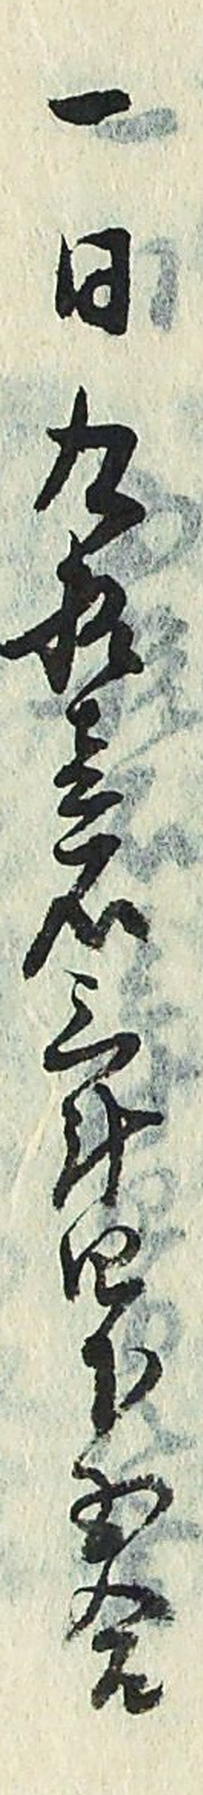一同九拾壱石三斗四升五合
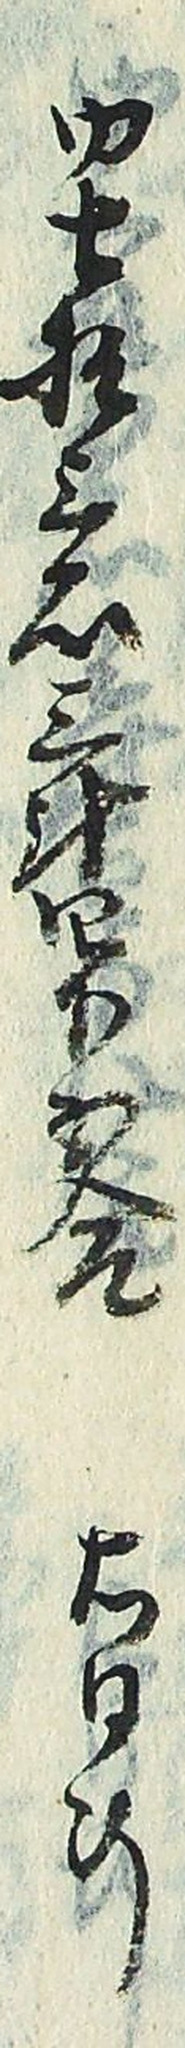内七拾三石三斗四升五合右同断
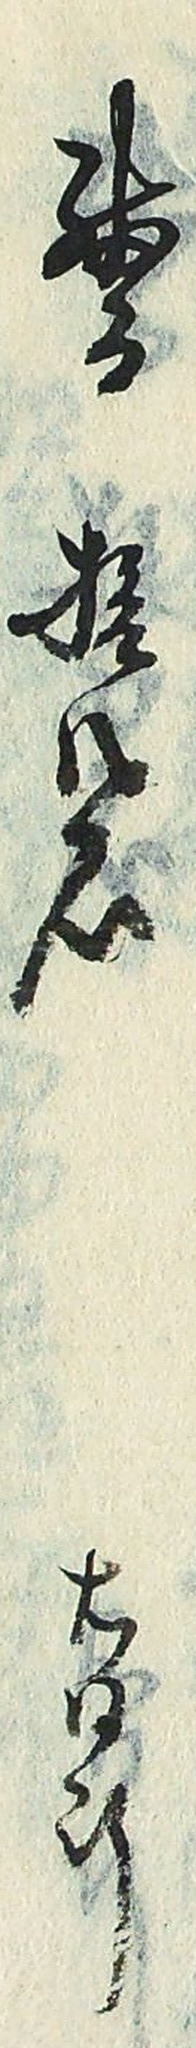残而拾八石右同断
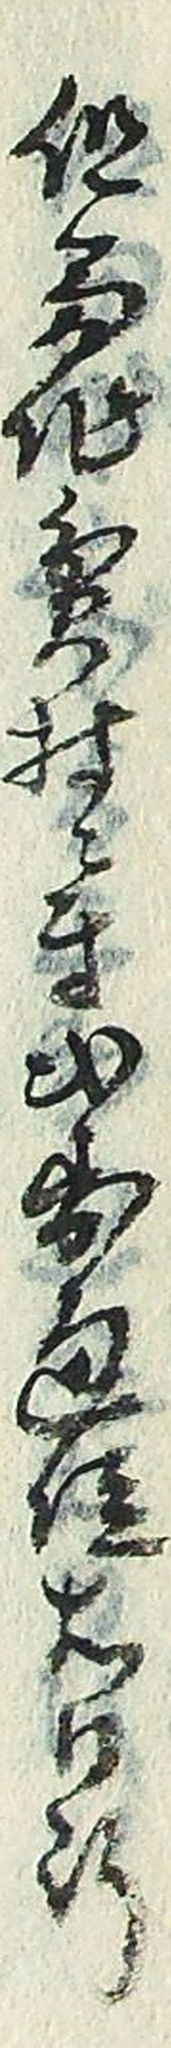但畠作貧村ニ付弐歩通位右同断

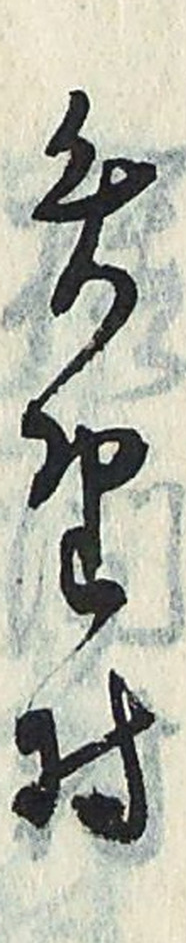矢野村
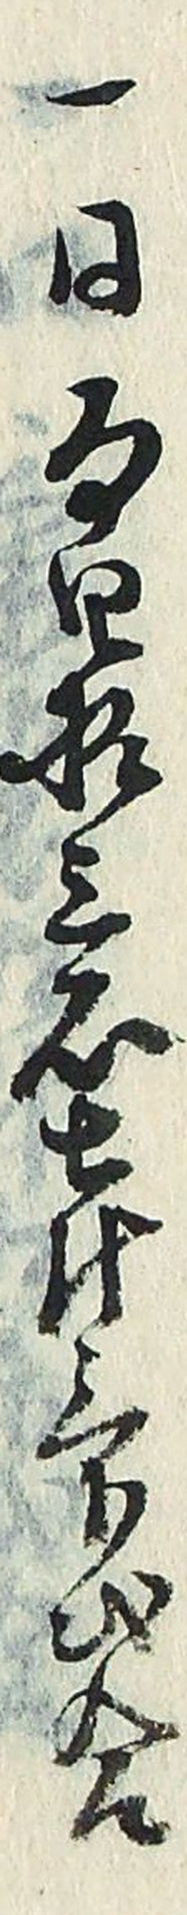一同百四拾三石七斗三升弐合
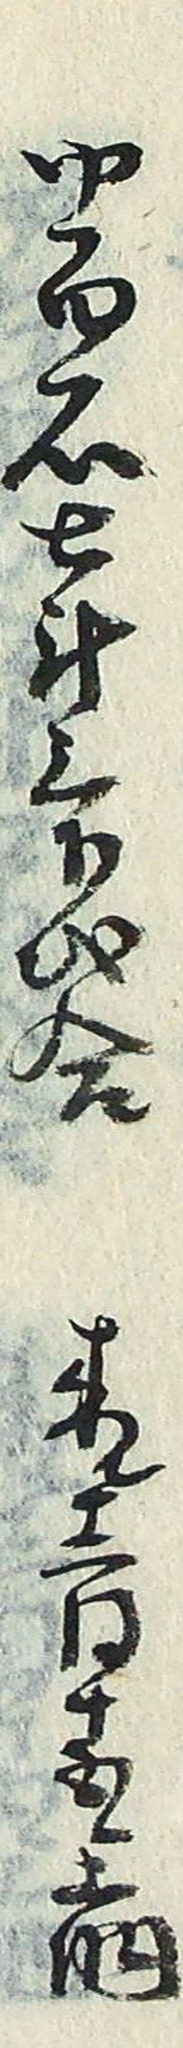内百石七斗三升弐合来ル十二月十五日上納
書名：諸御趣意書并御下知向之写
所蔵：鳴門教育大学 Naruto University of Education
